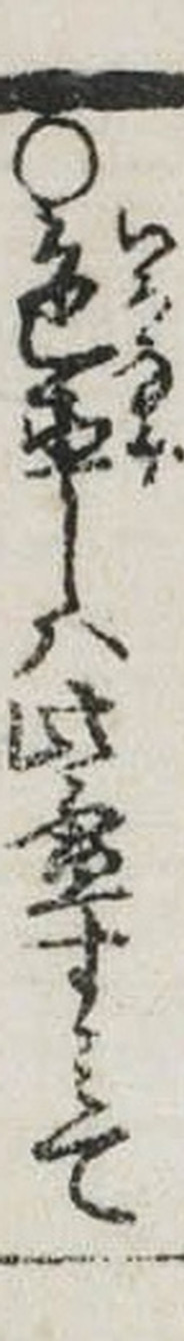○色直しは此盃すみて
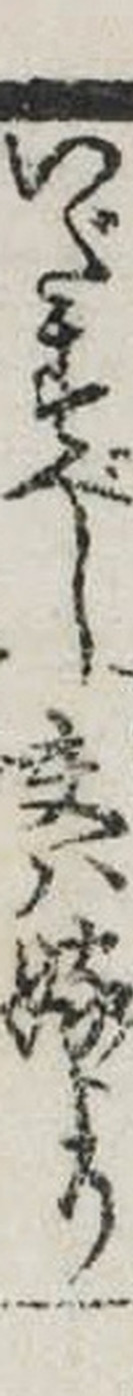いだすべし夫は嫁より
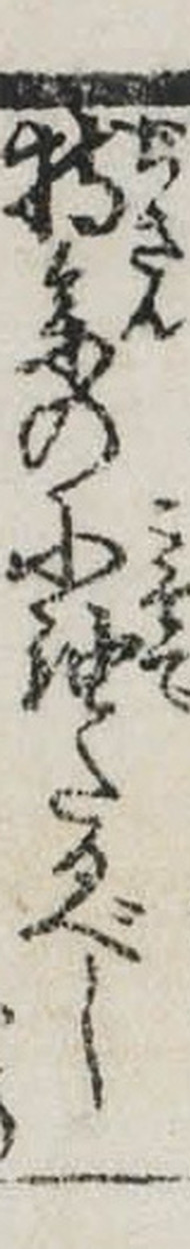持参の小袖たるべし
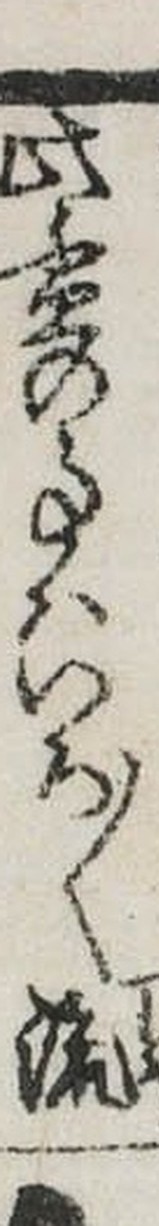此盃の事はいろ〳〵流
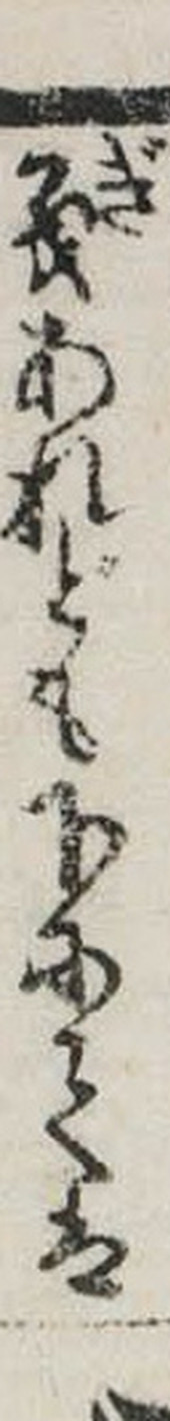義あれども下にては
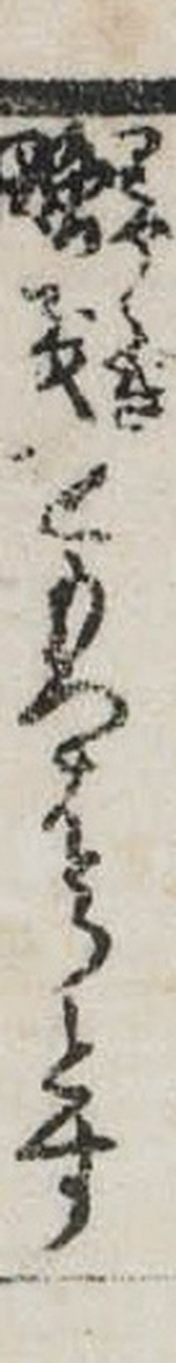略義をもつはらとす
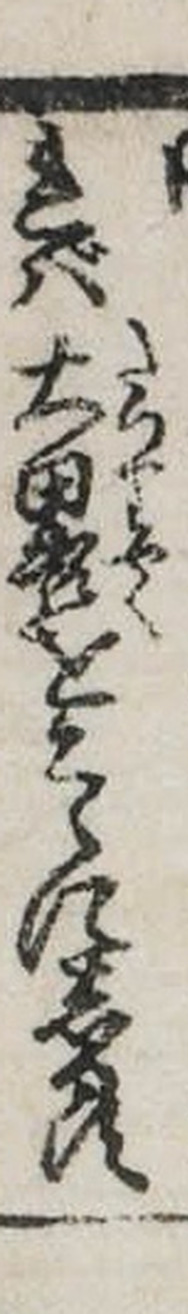れば大略をこゝにしるす
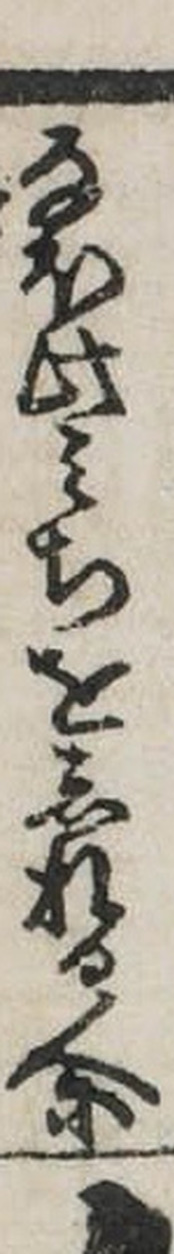なほ此みちをしれる人に
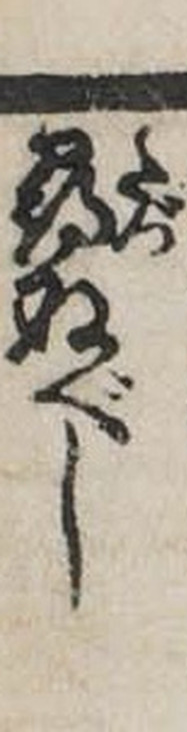尋ぬべし
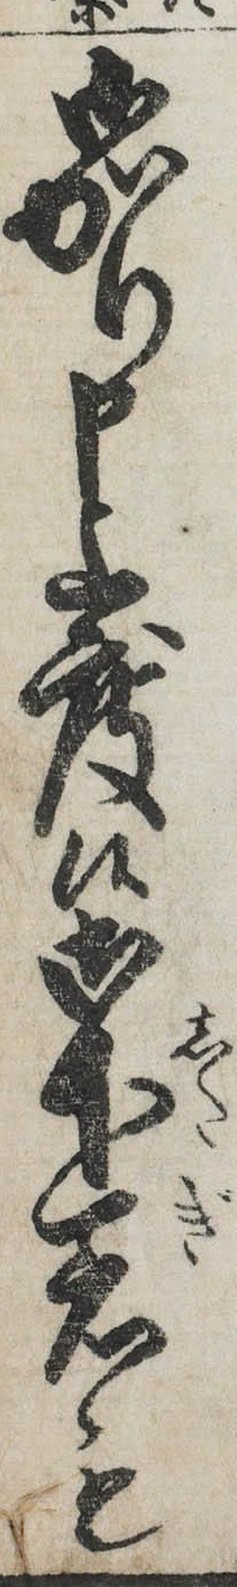御かり申上度候御下着も

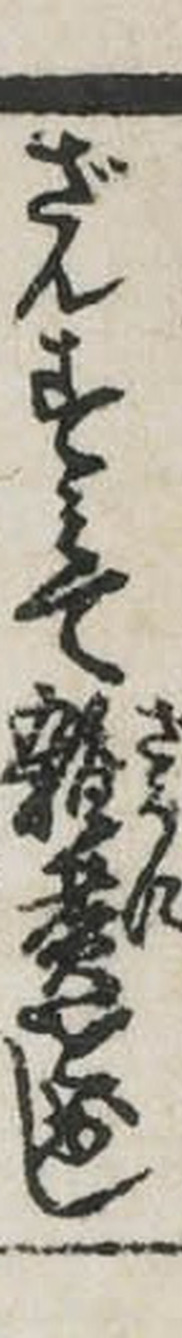ざんすみて雑煮を出し
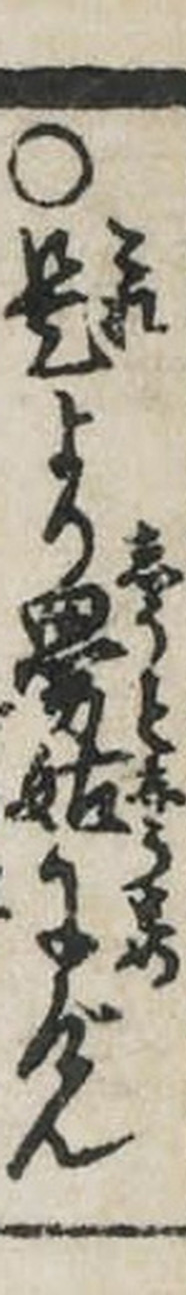○是より舅姑にげん
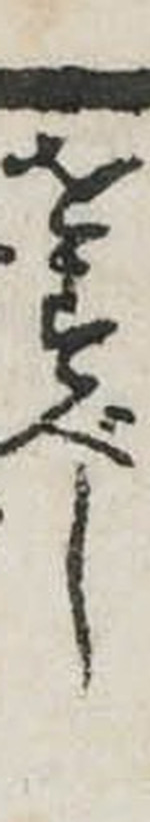をすべし
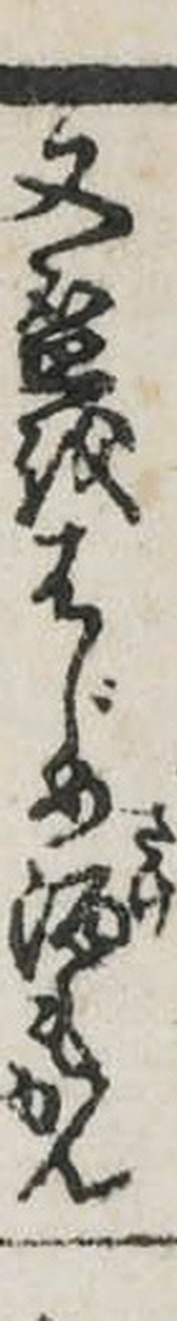又盃をはじめ酒もかん
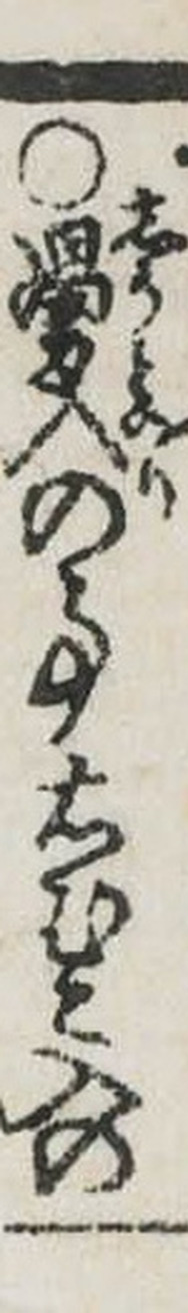○舅入の事右むこ入の
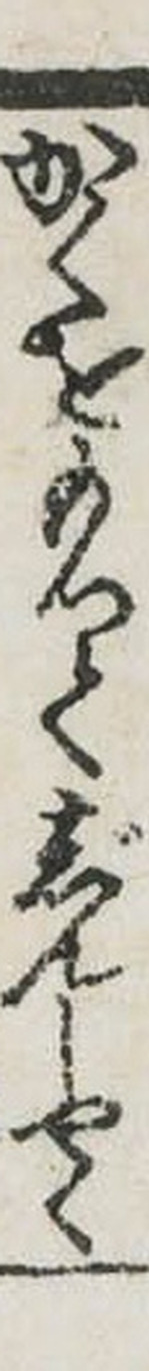かくをもつてじんしやく
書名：頭書萬用婦人手紙之文言
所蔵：東京学芸大学教育コンテンツアーカイブ
